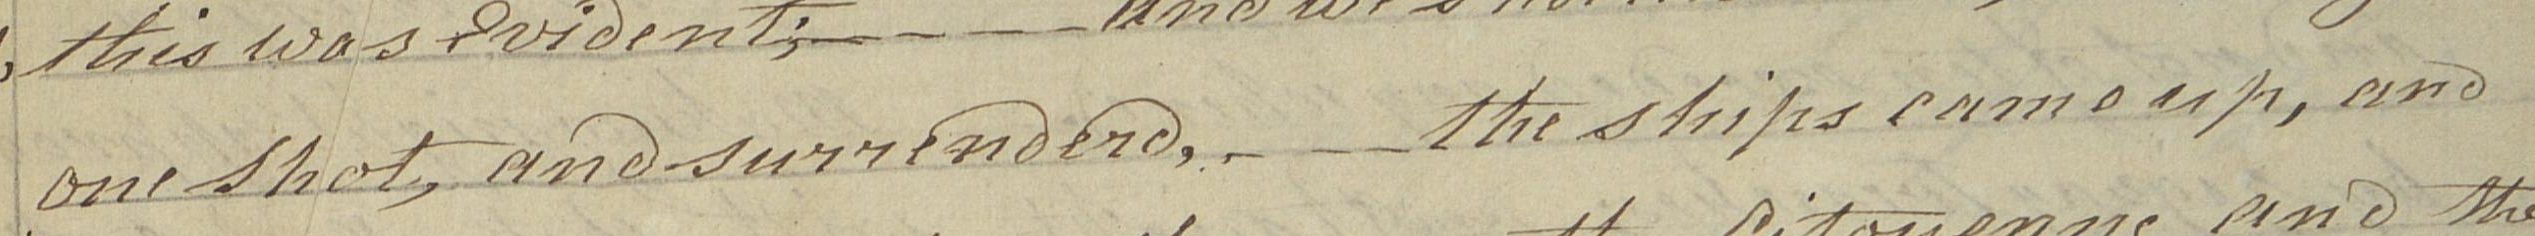one shot, and surrenderd,- The ships came up, and
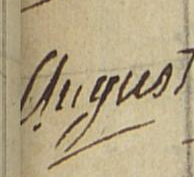August
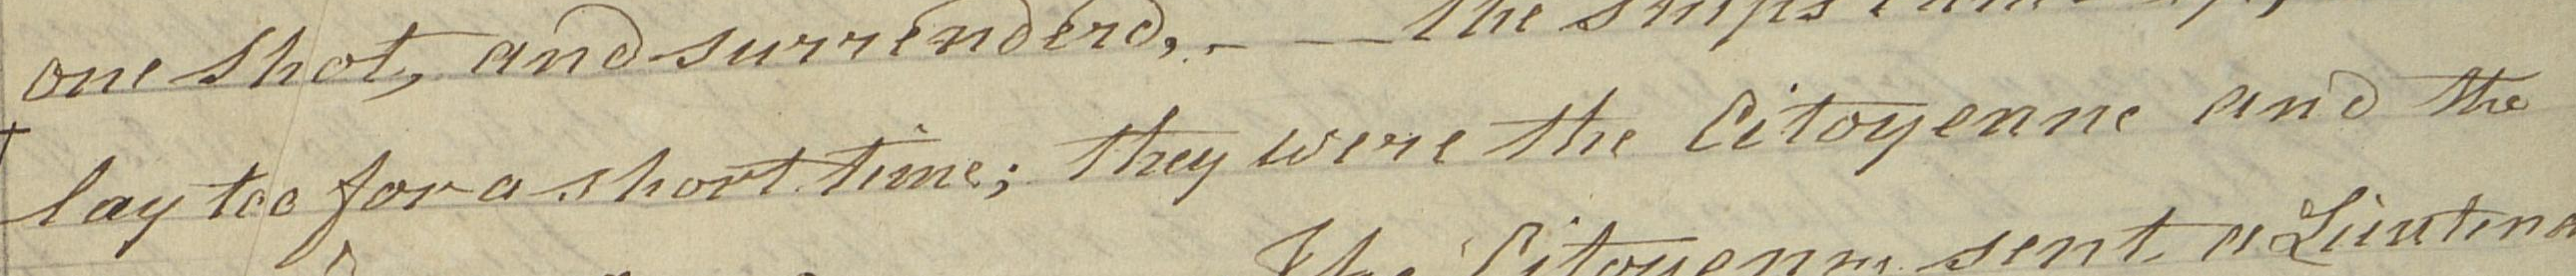lay too for a short time; they were the Citoyenne and the
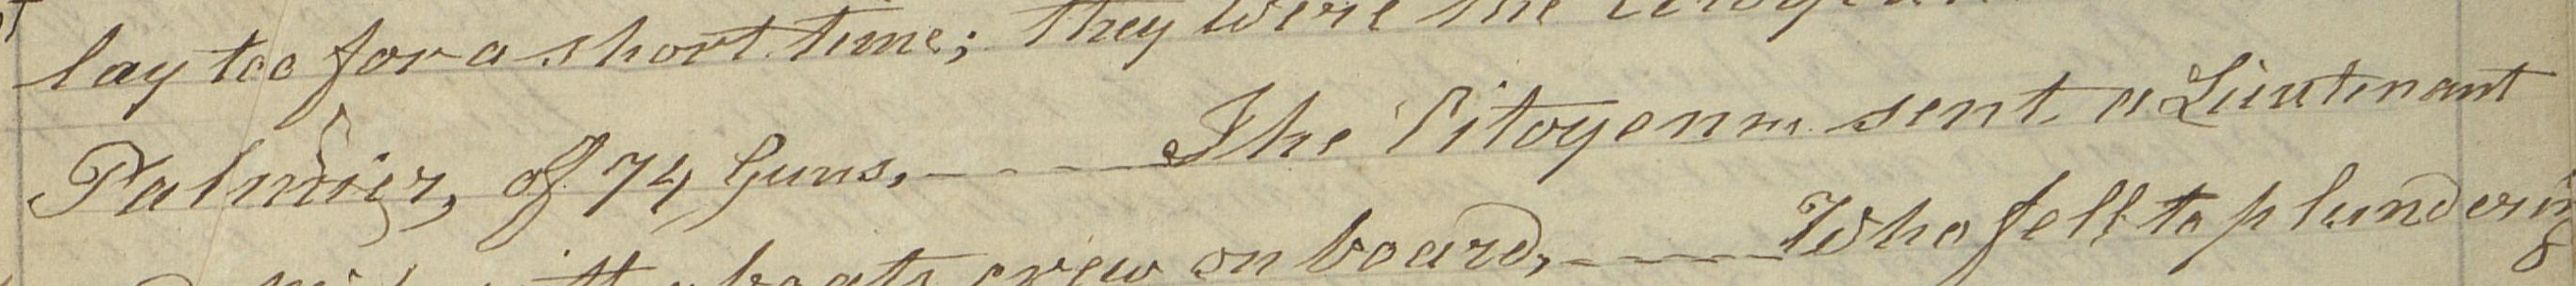Palmier of 74 Guns, The Citoyenne sent a Lieutenant
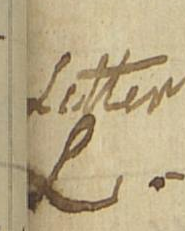Letter
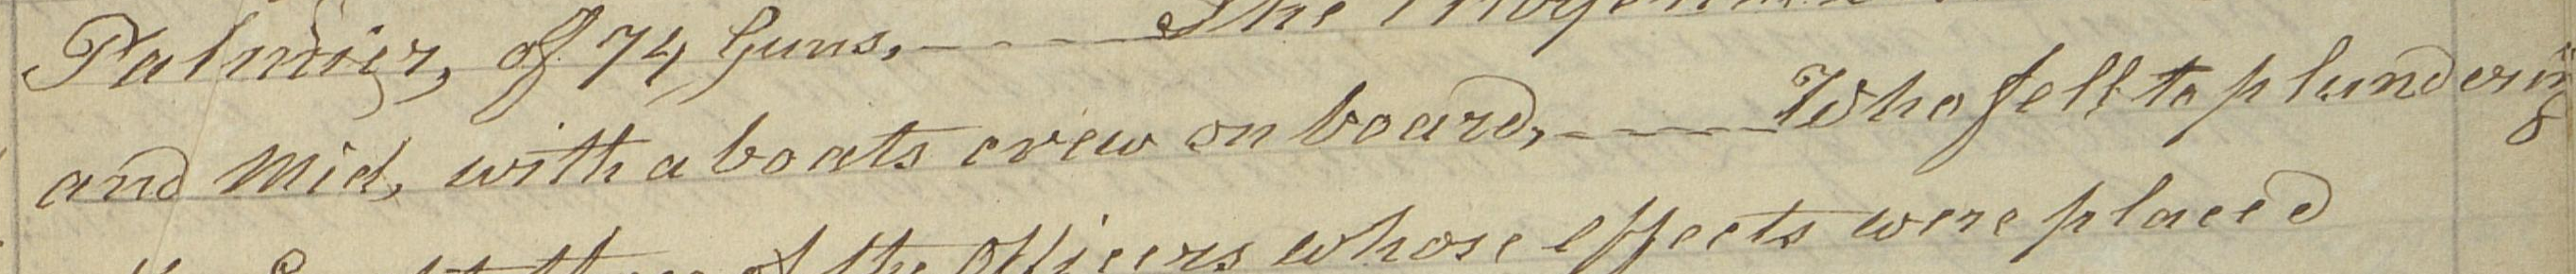and Mid with a boats crew on board, Who fell to plundering
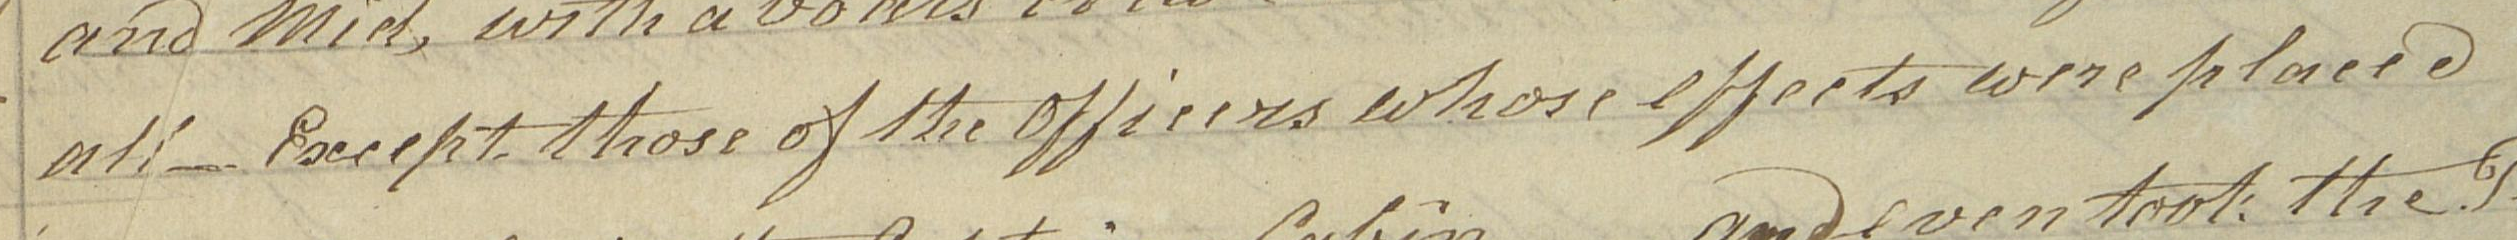all. Except those of the Officers whose effects were placed
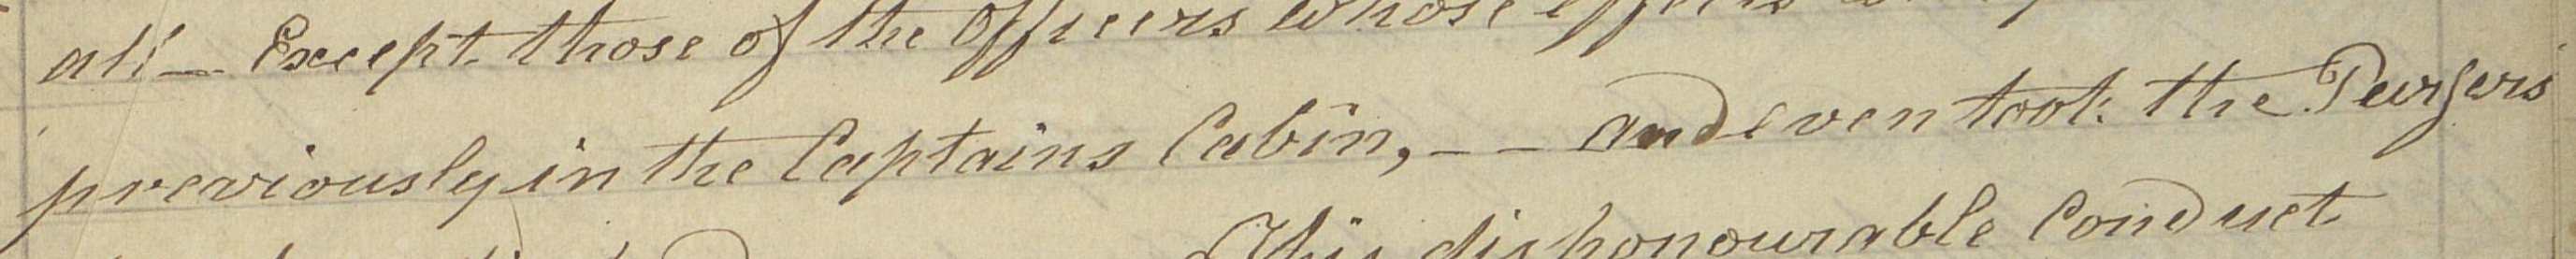previously in the Captains Cabin, and even took the Pursers
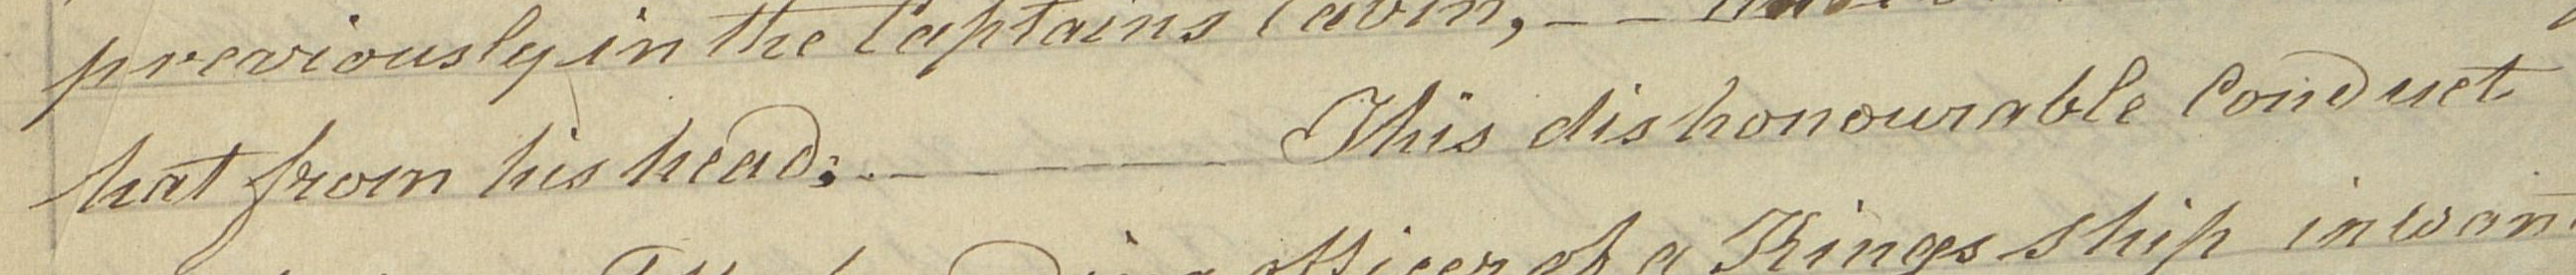hat from his head. This dishonourable conduct
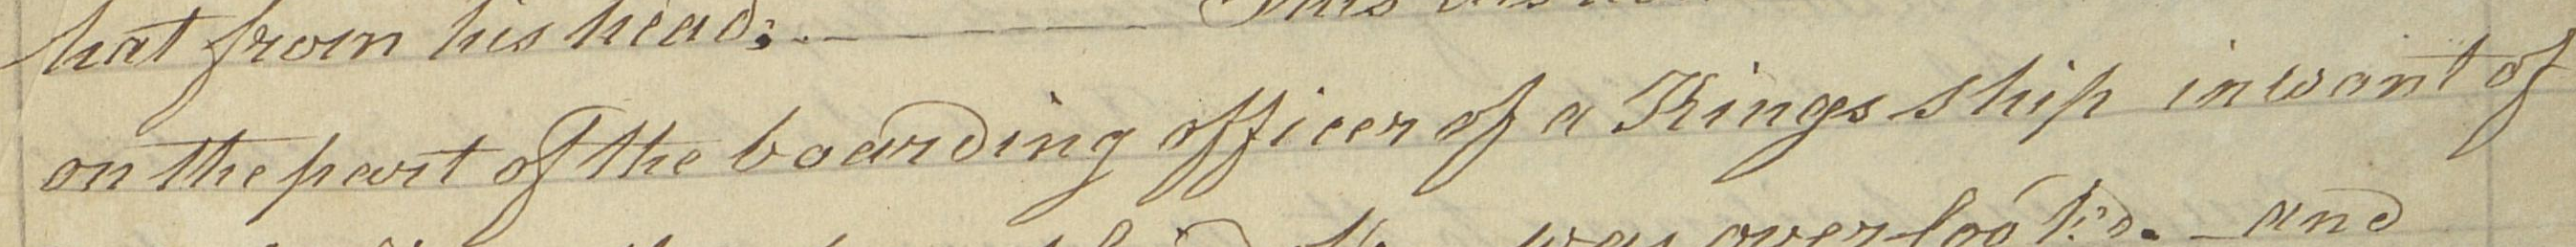on the part of the boarding officer of a Kings Ship in want of
